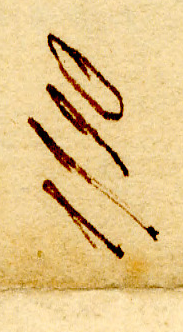1/10
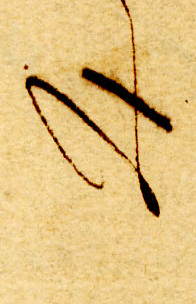4
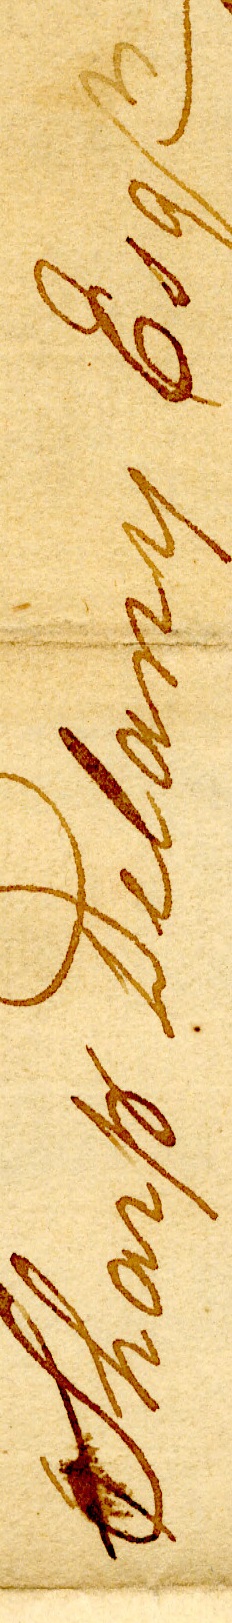Sharp Delany Esq^r
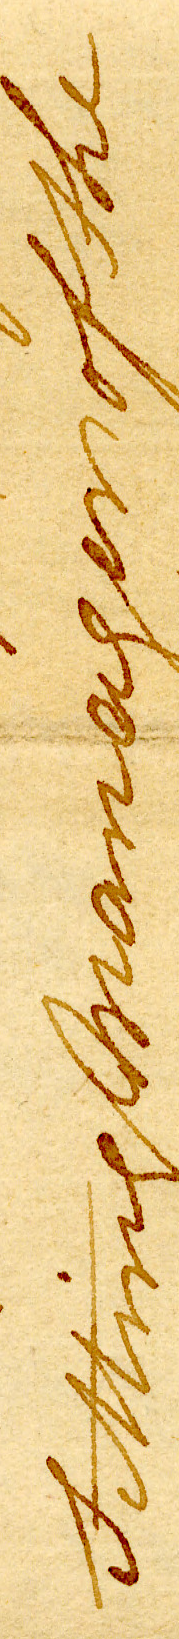Sitting Manager of the
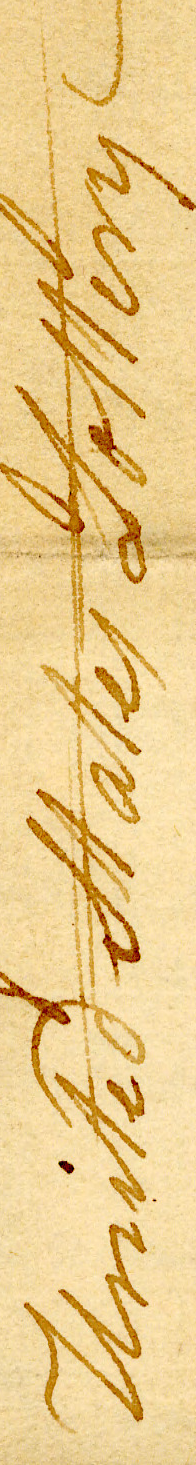United States Lottery
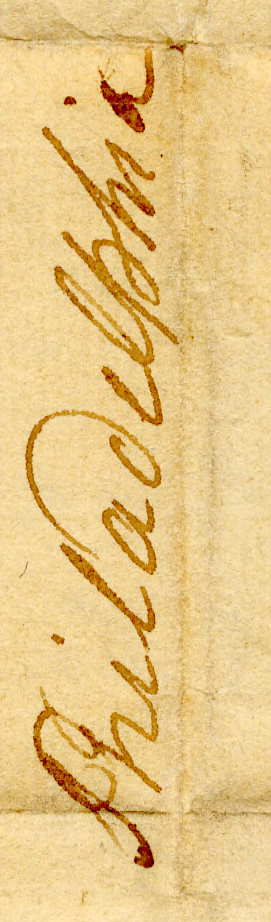Philadelphia
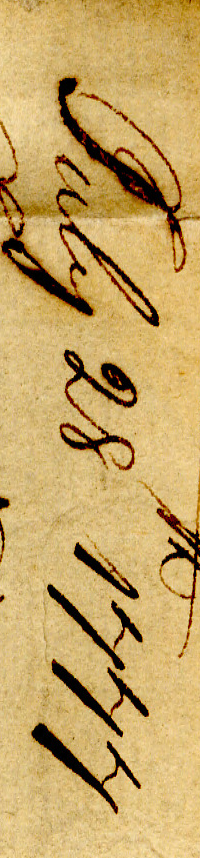July 28^th 1777
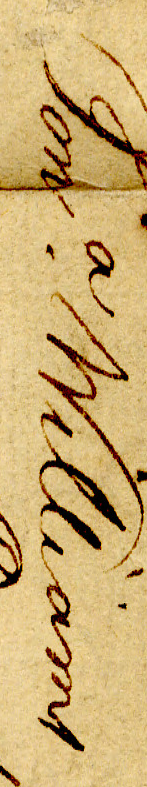Jon.^a Williams
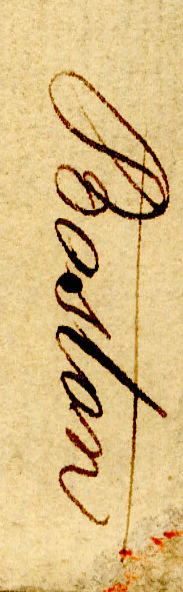Boston
